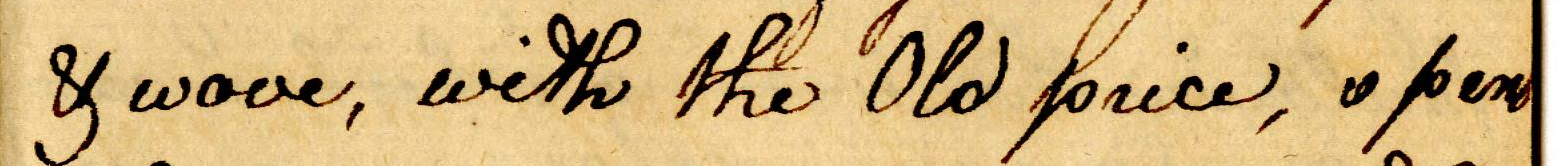& wove, with the Old price, spen
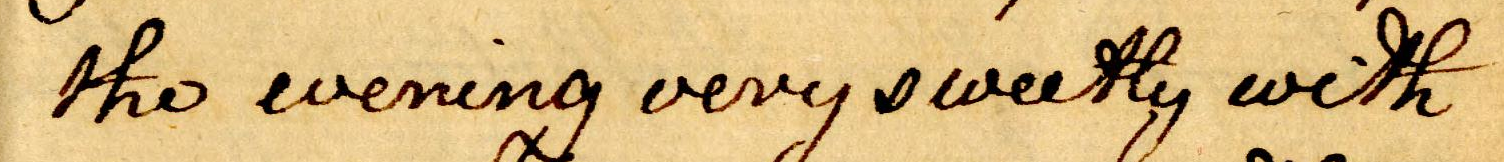the evening very sweetly with
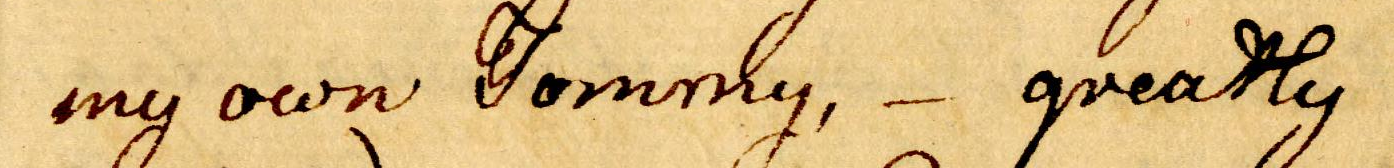my own Tommy,- greatly
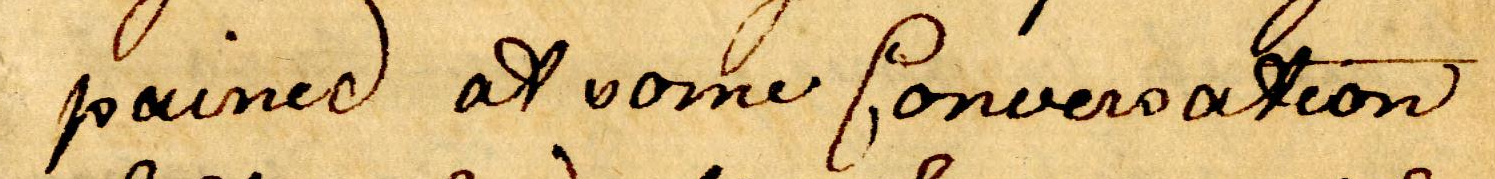pained at some Conversation
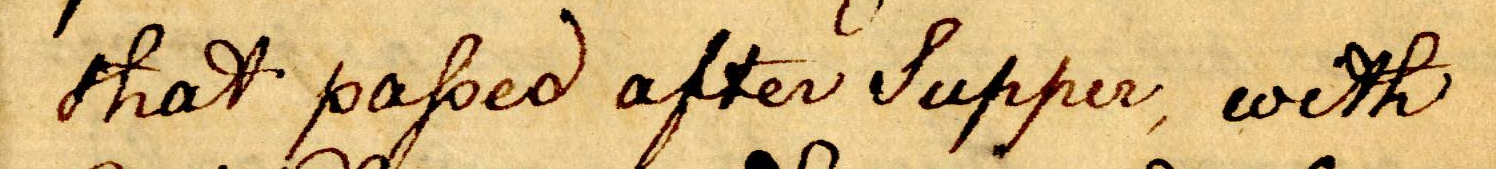that passed after Supper, with
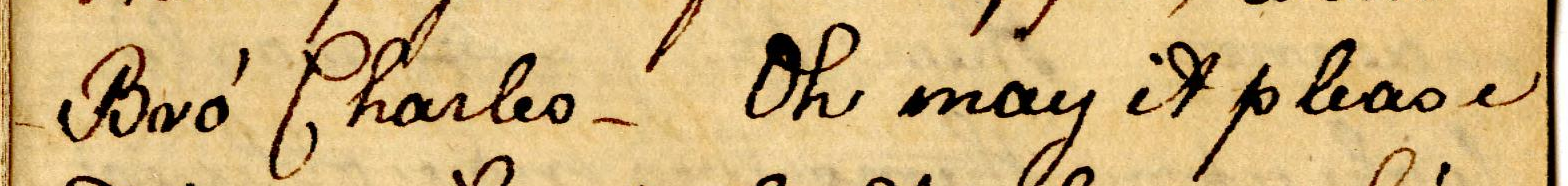Bro' Charles- Oh may it please
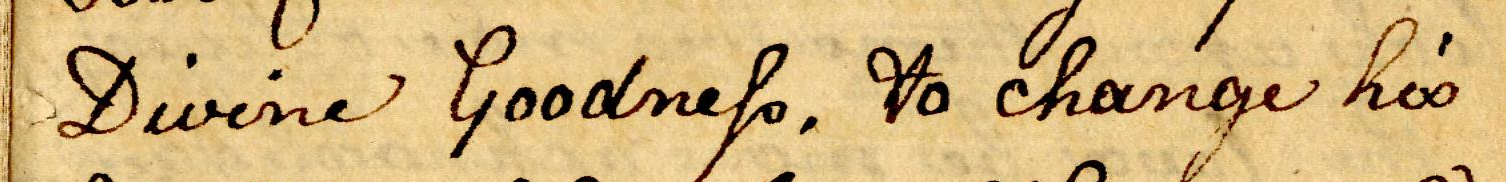Divine Goodness, to change his
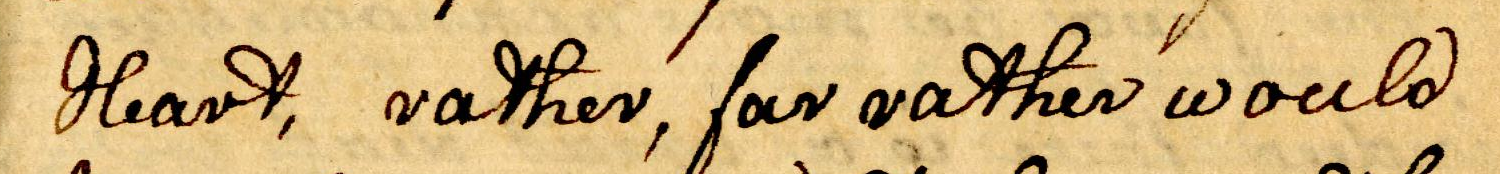Heart, rather, far rather would
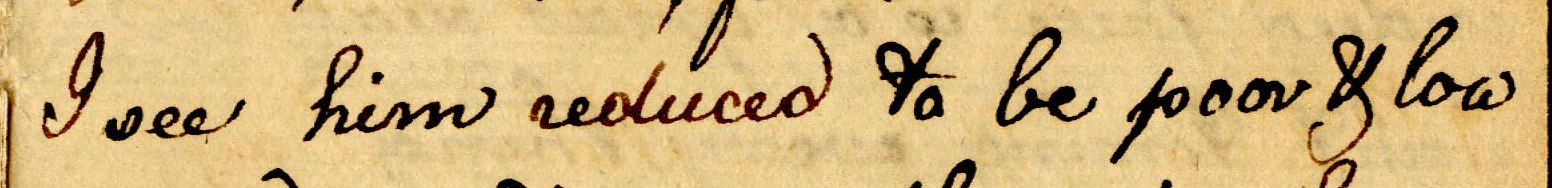I see him reduced to be poor & low
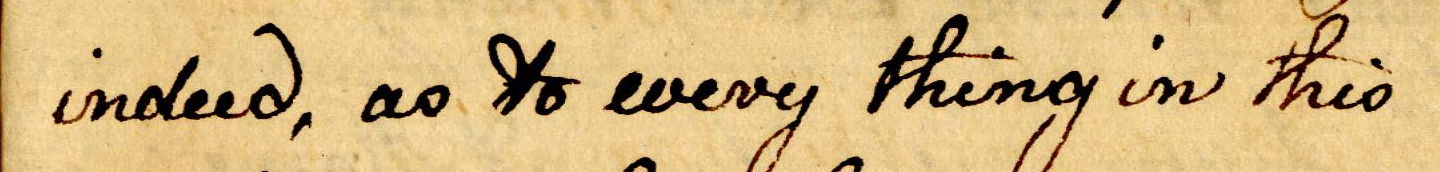indeed, as to every thing in this
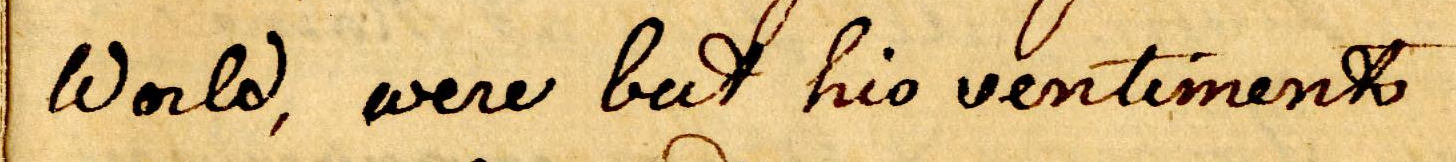World, were but his sentiments
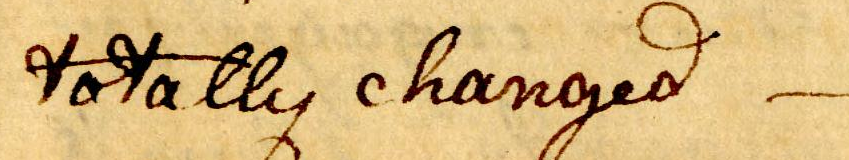totally changed-
